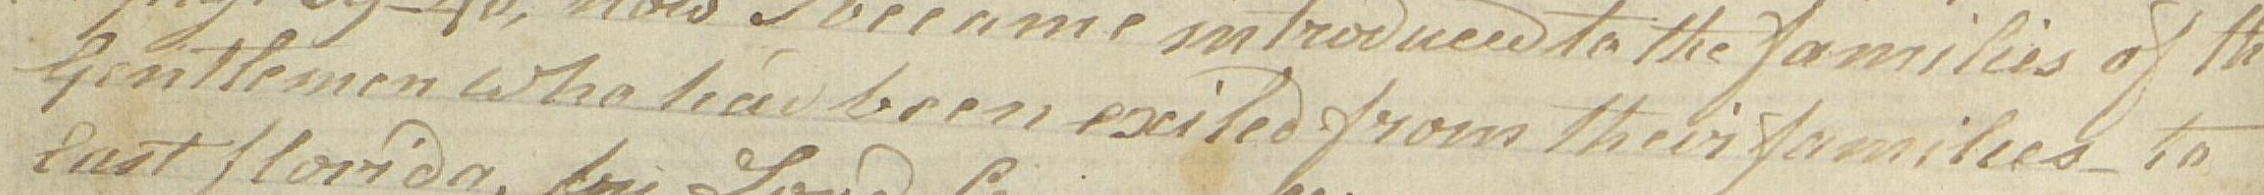Gentlemen who had been exiled from their families to
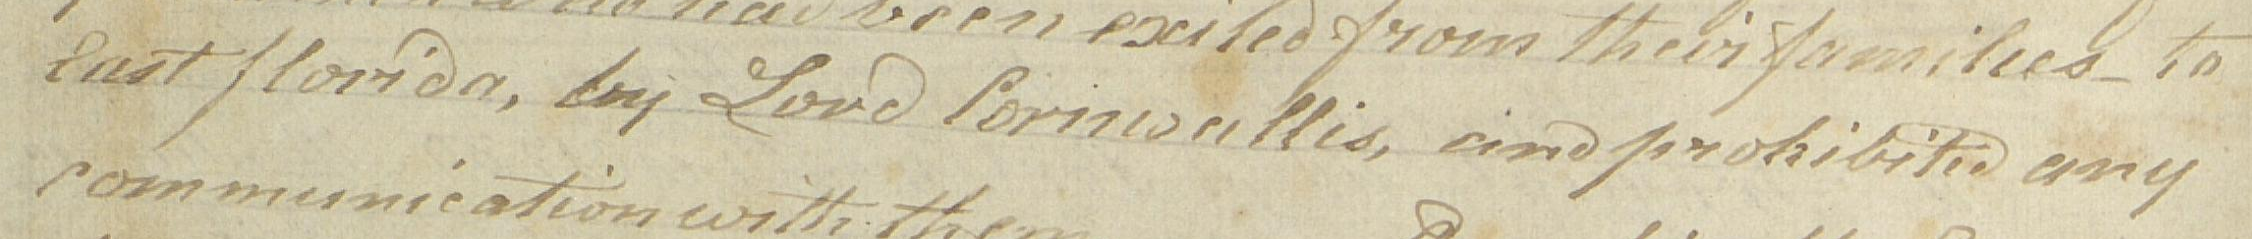East Florida, by Lord Cornwallis, and prohibited any
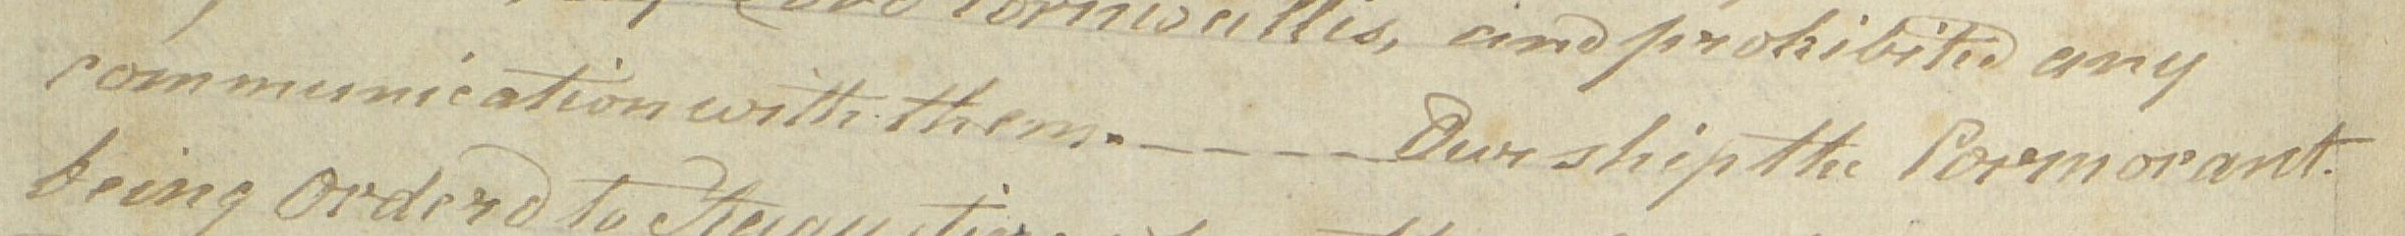communication with them. Our ship the Cormorant.
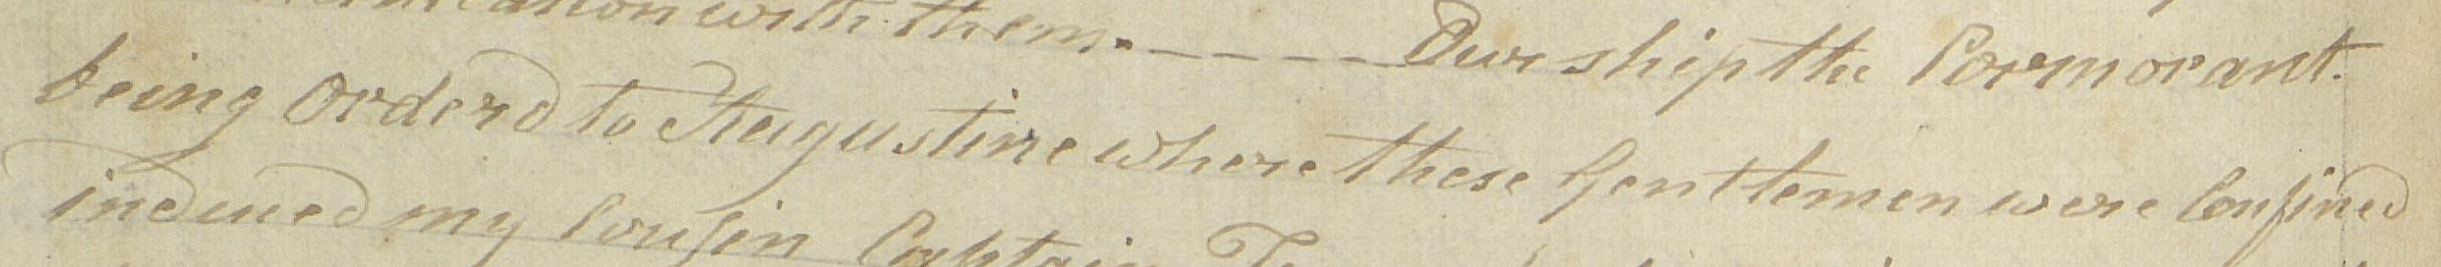being orderd to Augustine where these Gentlemen were Confined
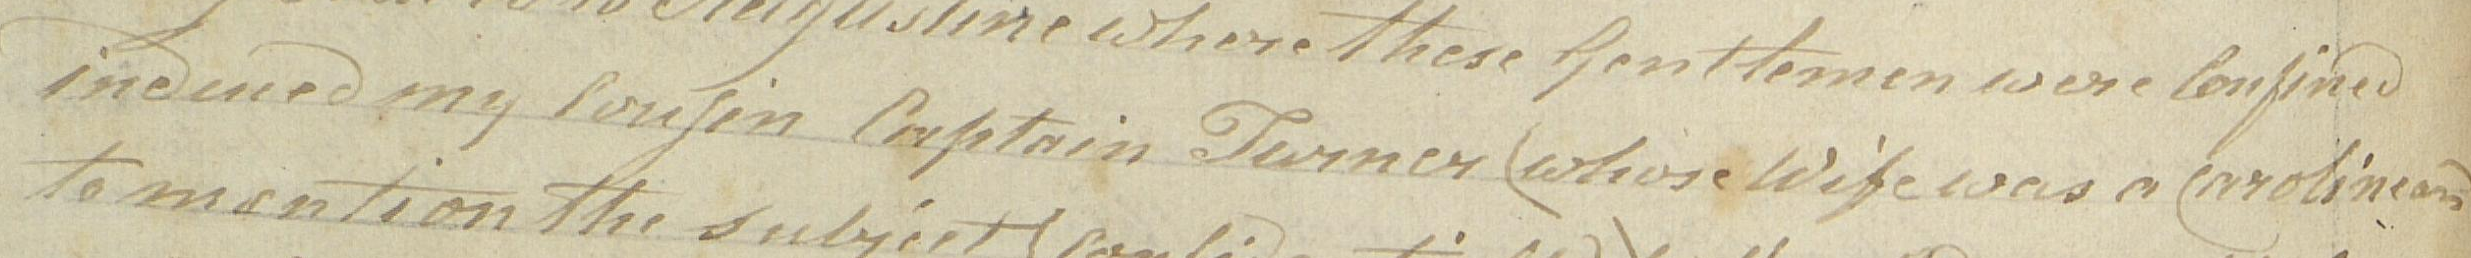induced my Cousin Captain Turner (whose Wife was a Carolinean)
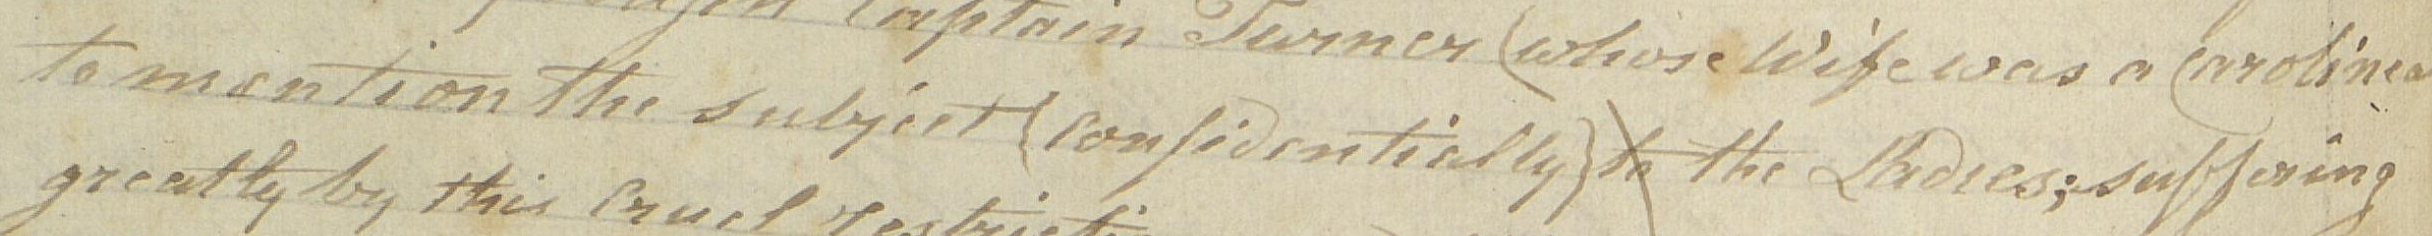to mention the subject (confidentially) to the Ladies; suffering
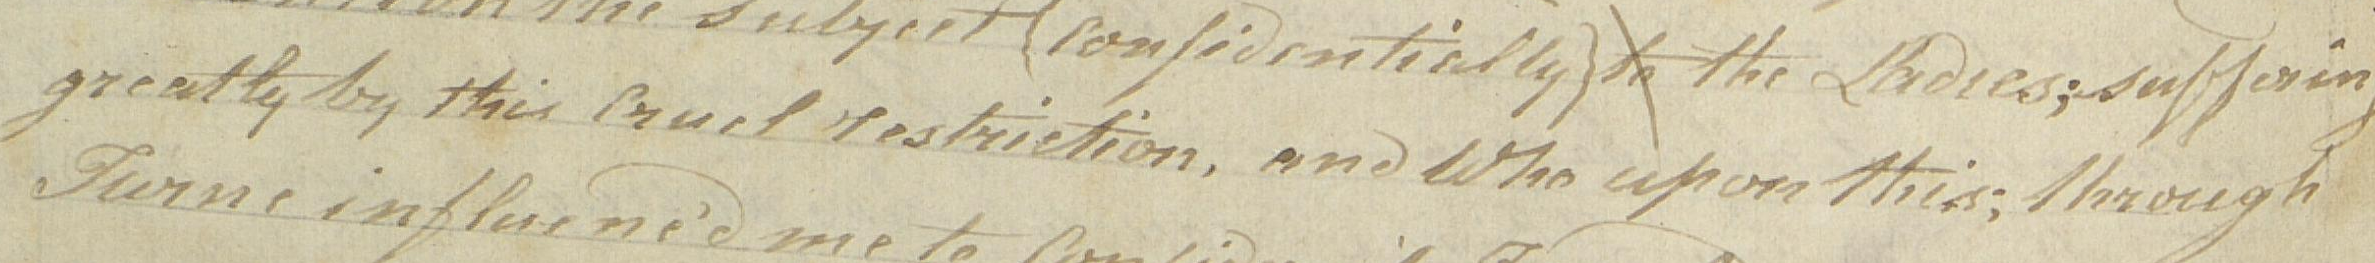greatly by this Cruel restriction, and Who upon this; through
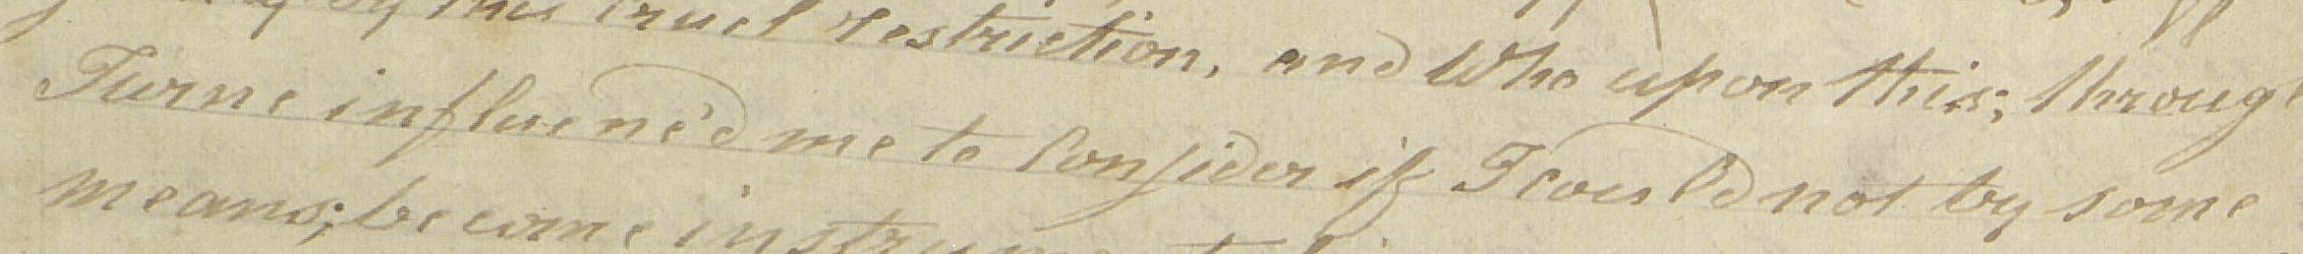Turne influenc'd me to Consider if I could not by some
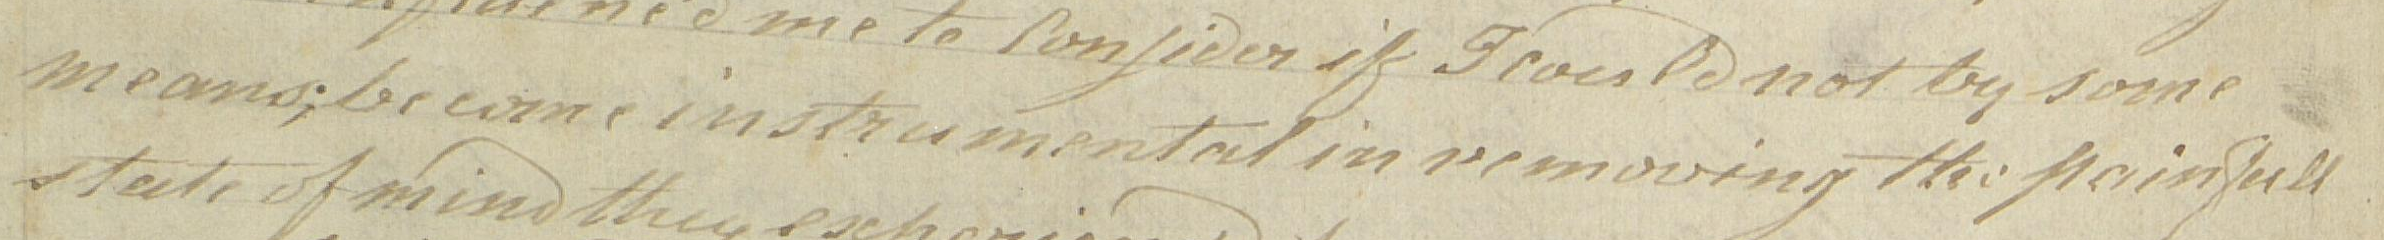means; became instrusmental in removing the painfull
